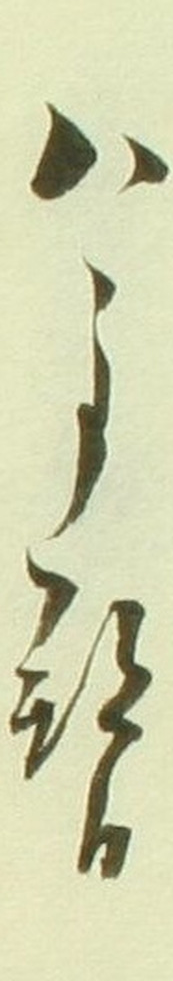八月朔日
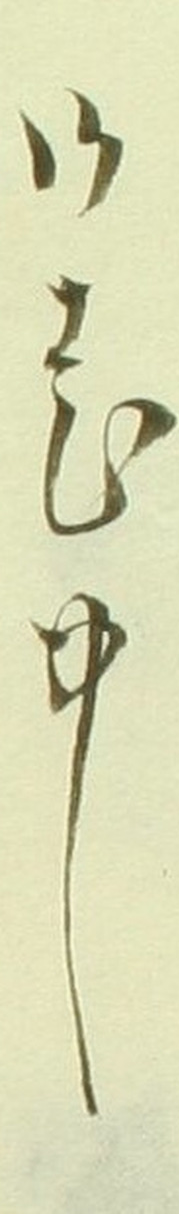御老中
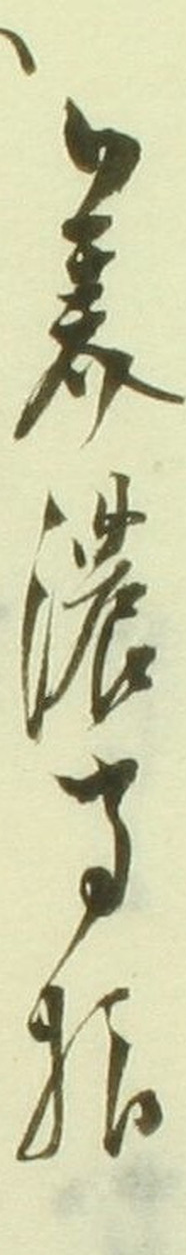美濃守様
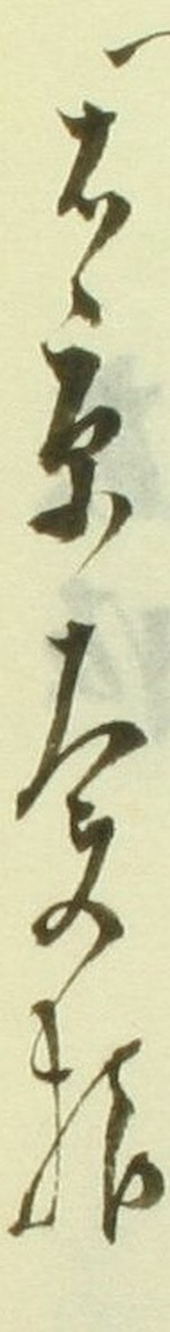右京大夫様
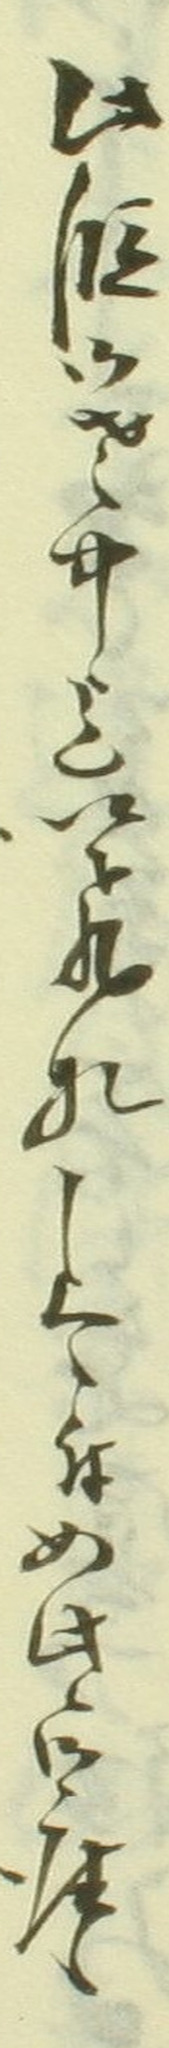此段御老中迄以飛札申上候付如此候御座候
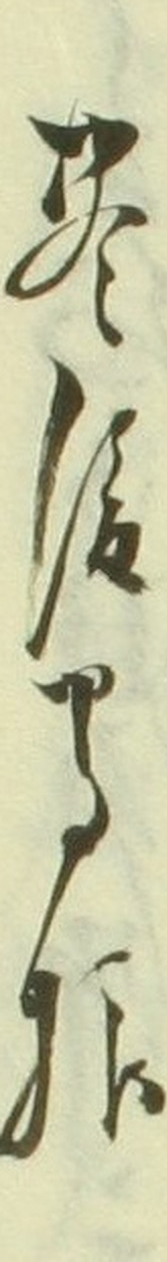豊後守様
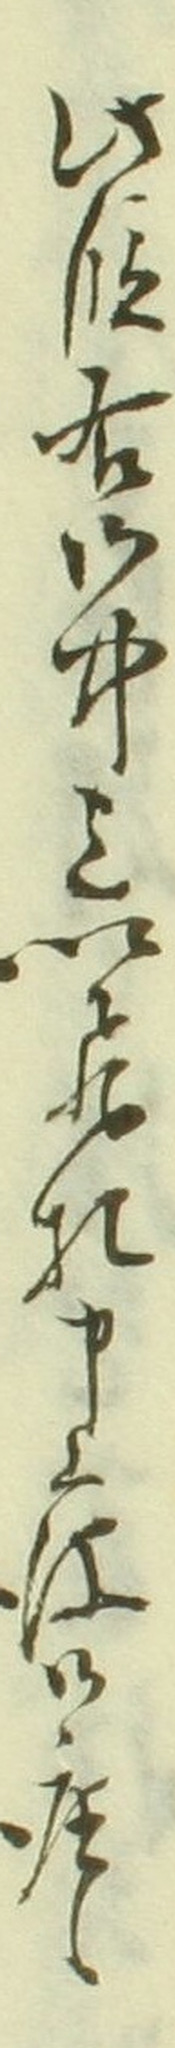此段右御中迄以飛札申上儀御座候
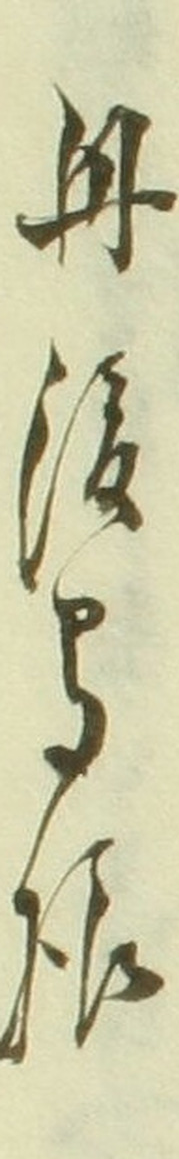丹後守様
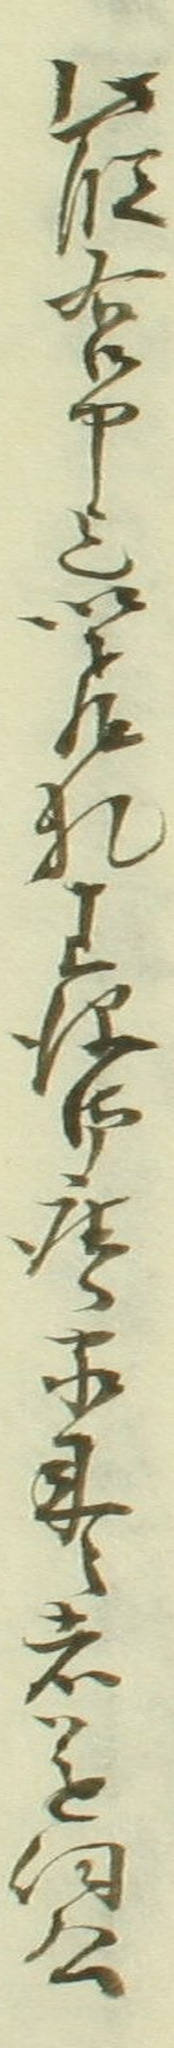此段右御中迄以飛札申上儀御座候家来之者遂伺公
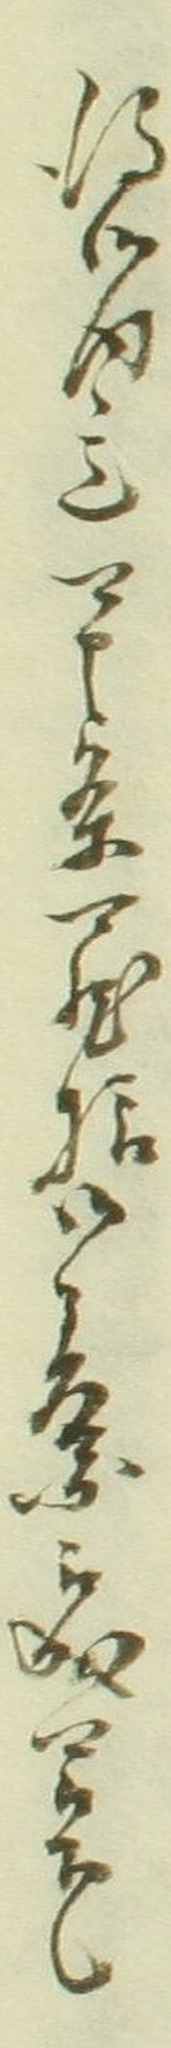得御内意可申条可然様御差図被成可被下候
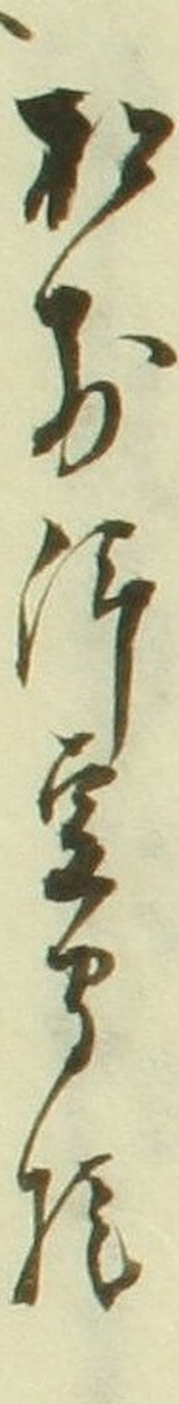松前伊豆守様
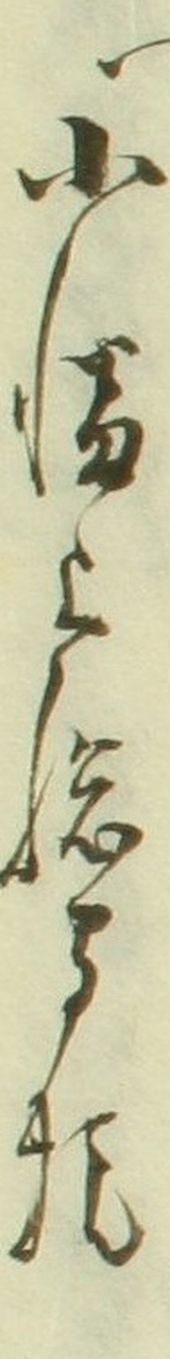小幡上総守様
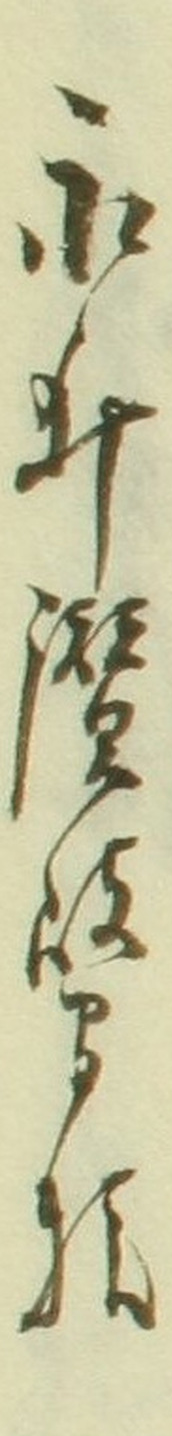同永井讃岐守様

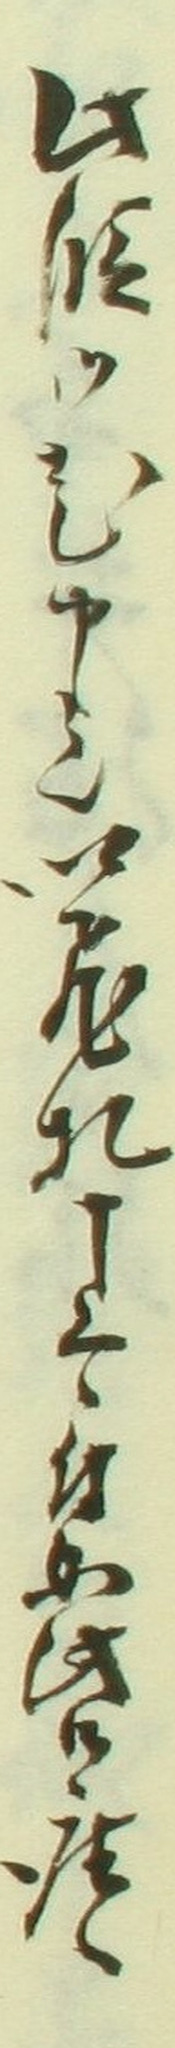此段御老中迄以飛札申上候付如此御座候
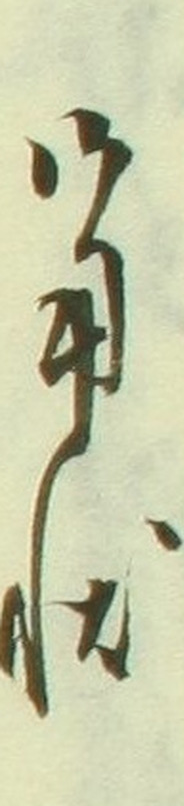御用状
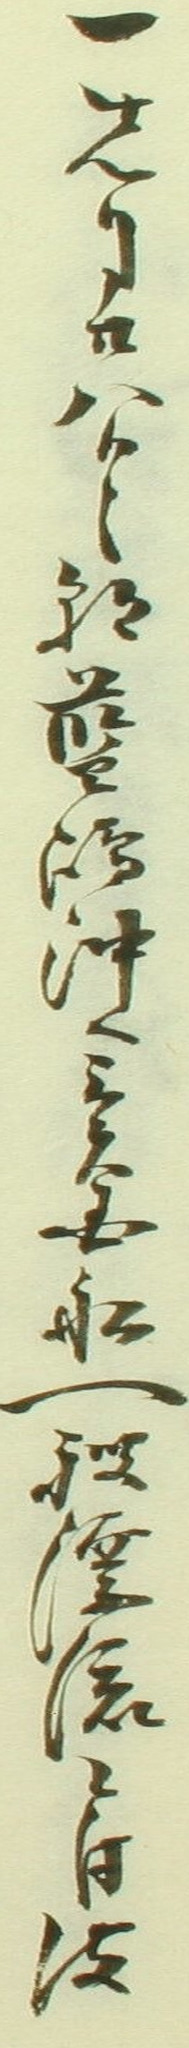一先月廿八日之朝藍嶋沖へ異国船一艘漂流ニ付波
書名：異国船漂着記
